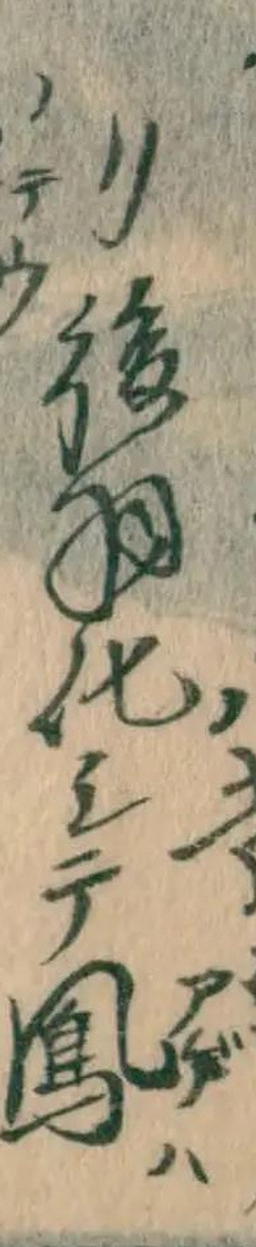リ後羽化シテ鳳
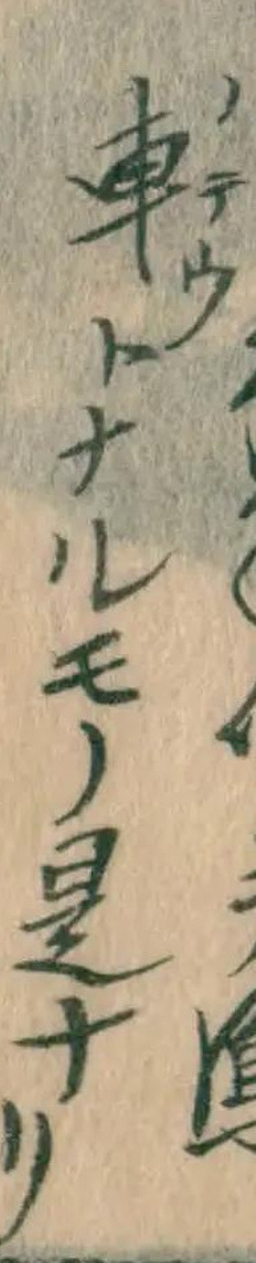車トナルモノ是ナリ

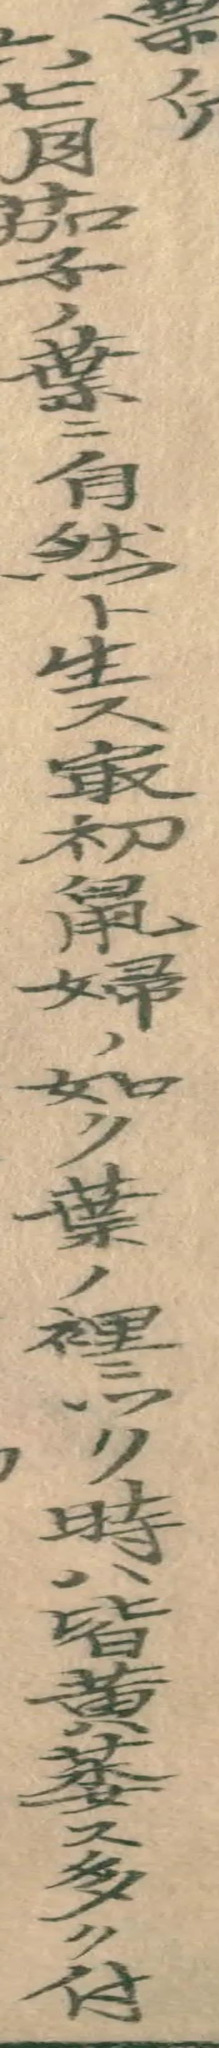六七月茄子ノ葉ニ自然ト生ス㝡初鼠婦ノ如ク葉ノ裡ニツク時ハ皆黄萎ス多ク付
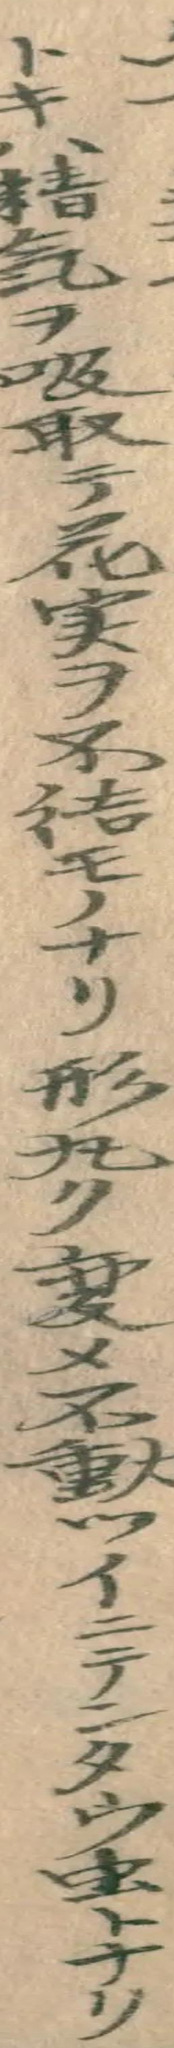トキハ精気ヲ吸取テ花実ヲ不結モノナリ形丸ク変シテ不動ツイニテンタウ虫トナリ
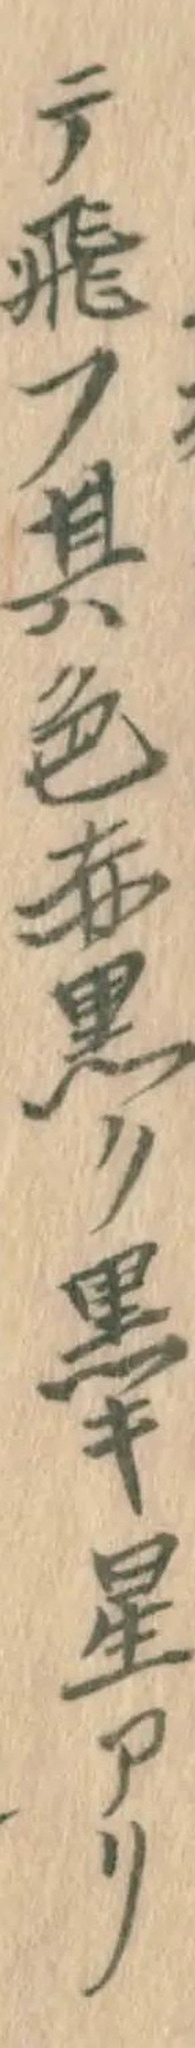テ飛フ其色赤黒ク黒キ星アリ
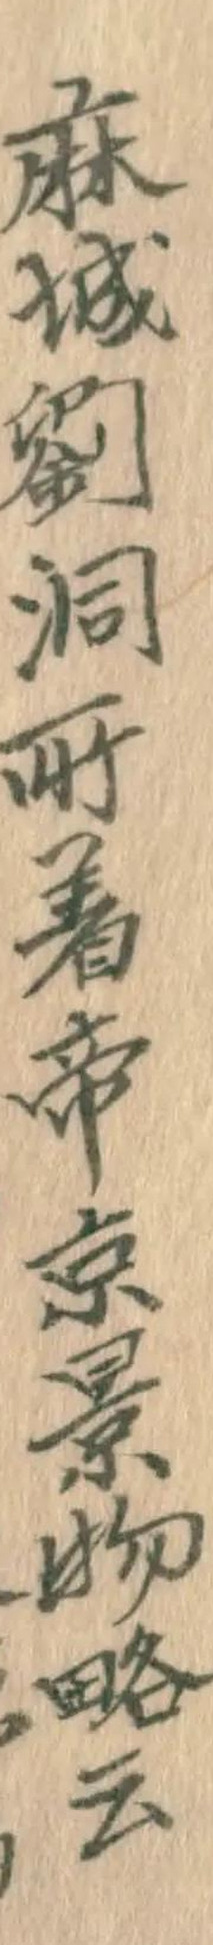麻城劉洞所著帝京景物略云
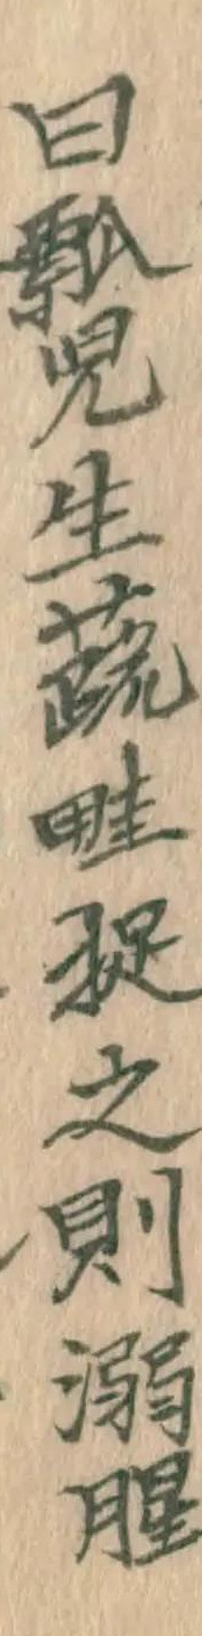曰瓢児生蔬畦捉之則溺腥
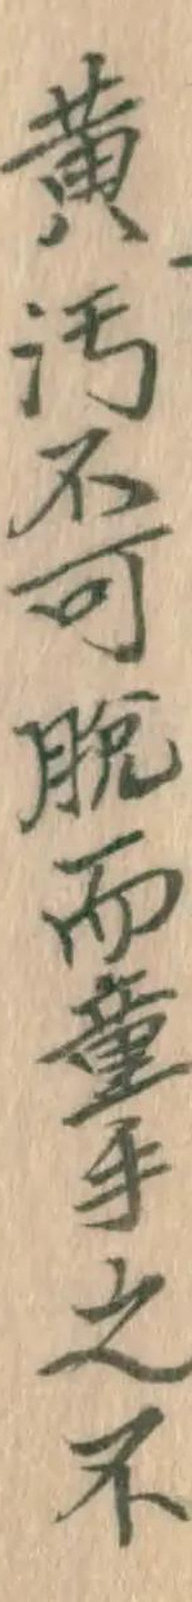黄汚不可脱而童手之不

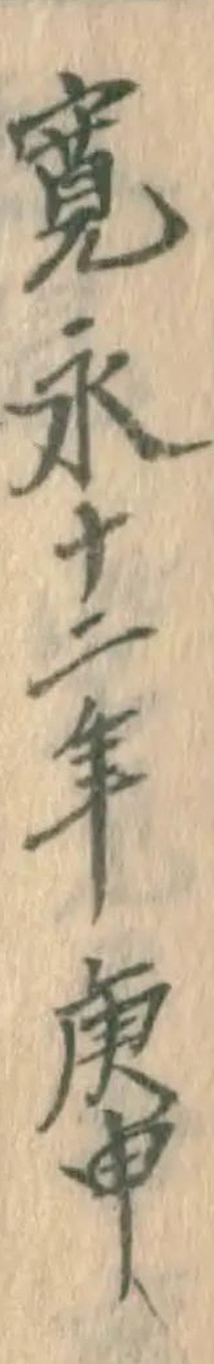寛永十二年庚申
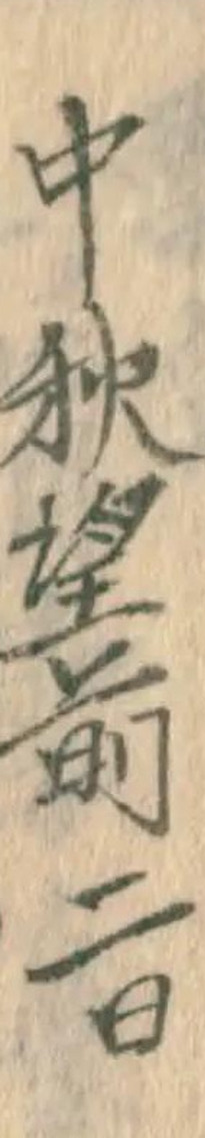中秋望前二日
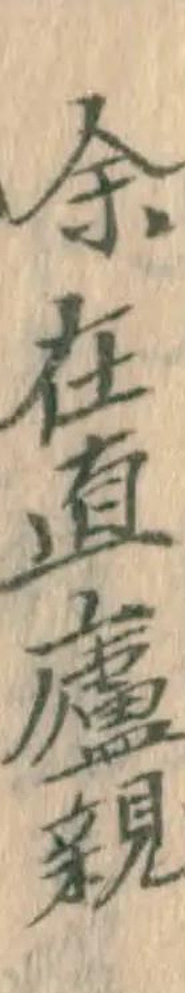余在直廬親
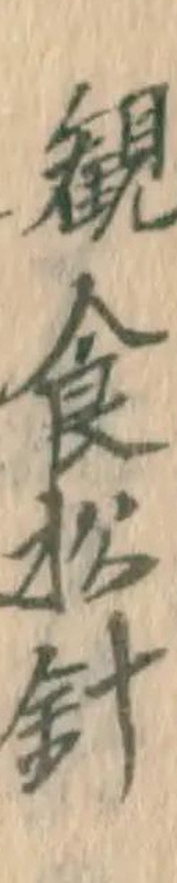観食松針
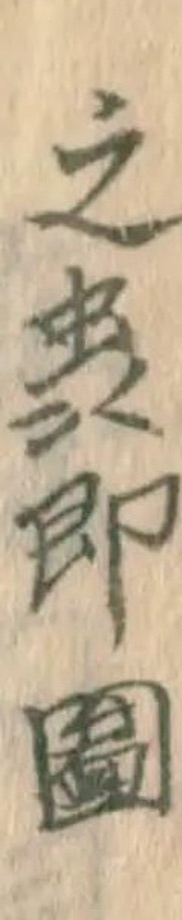之蟲即圖
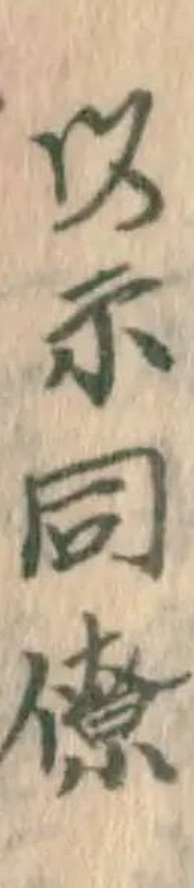以示同僚
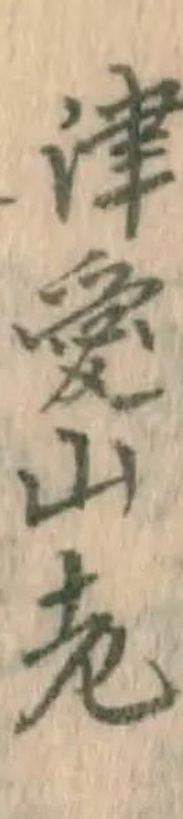津愛山老
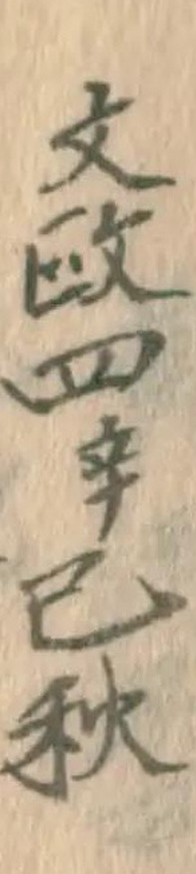文政四辛巳秋
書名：千蟲譜 3巻. [1]
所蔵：国立国会図書館 National Diet Library, JAPAN
